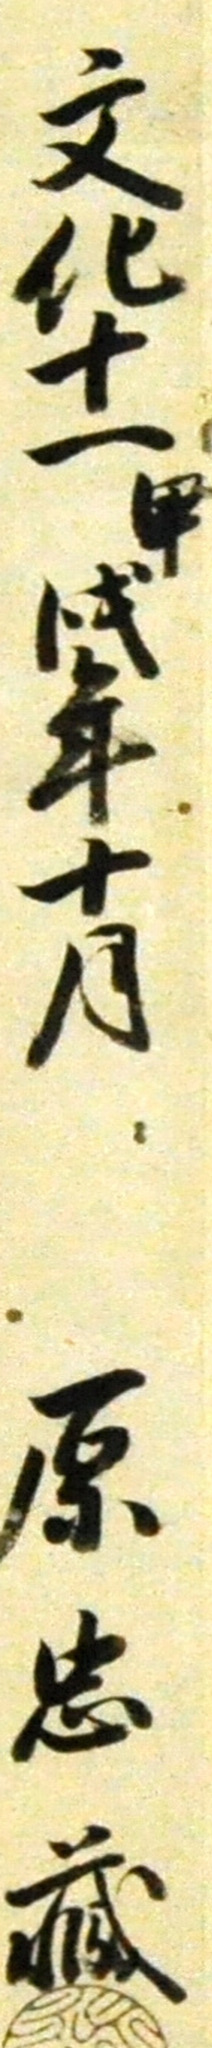文化十一甲戌年十月原忠蔵㊞
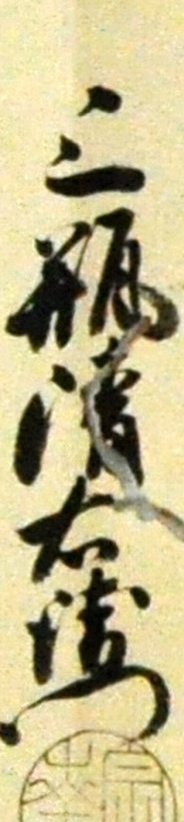三瓶清右衛門㊞
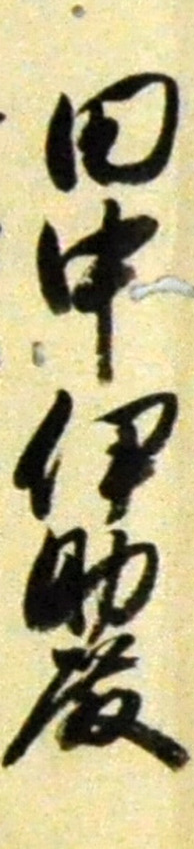田中伊助殿
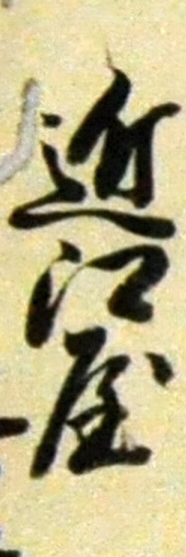近江屋
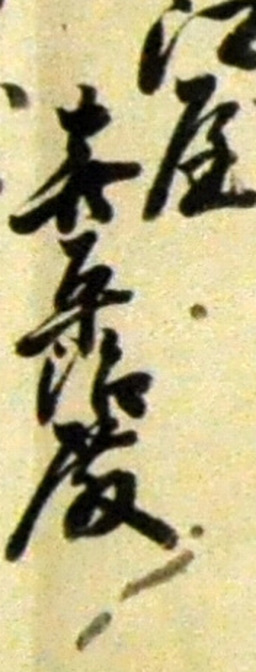喜平治殿

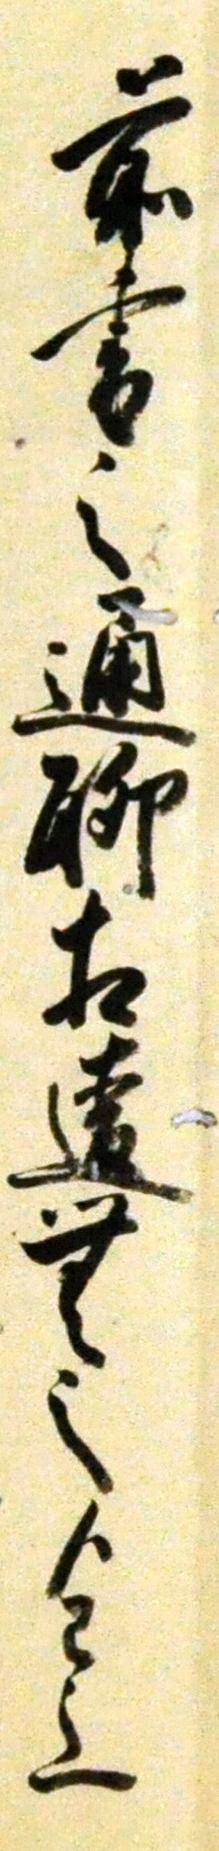前書之通聊相違無之候已上

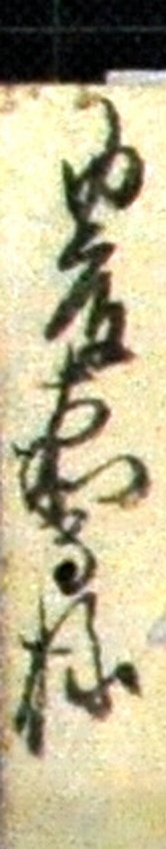内藤大和守様
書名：預り申金子之事
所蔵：伊那市立高遠町図書館・合同会社AMANE
